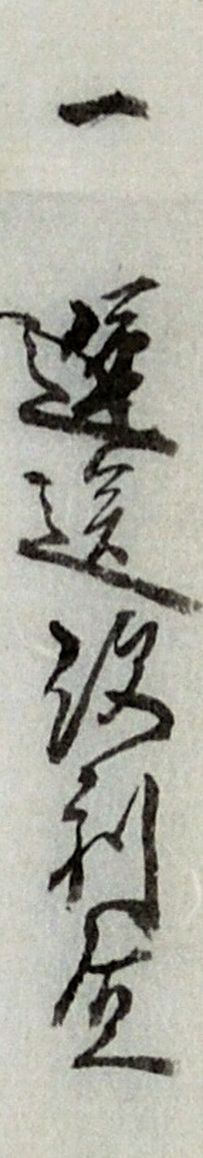一運送便利宜
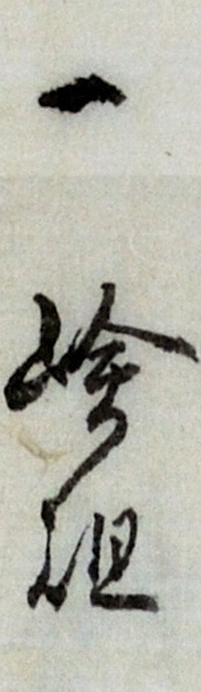一嶮岨
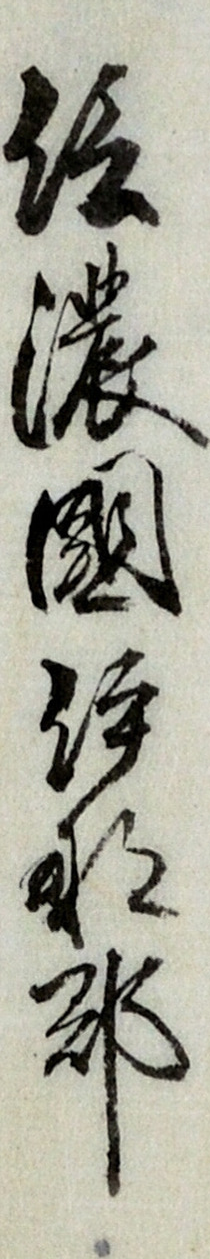信濃国伊那郡
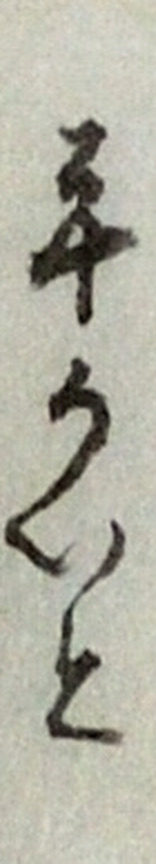平ういと
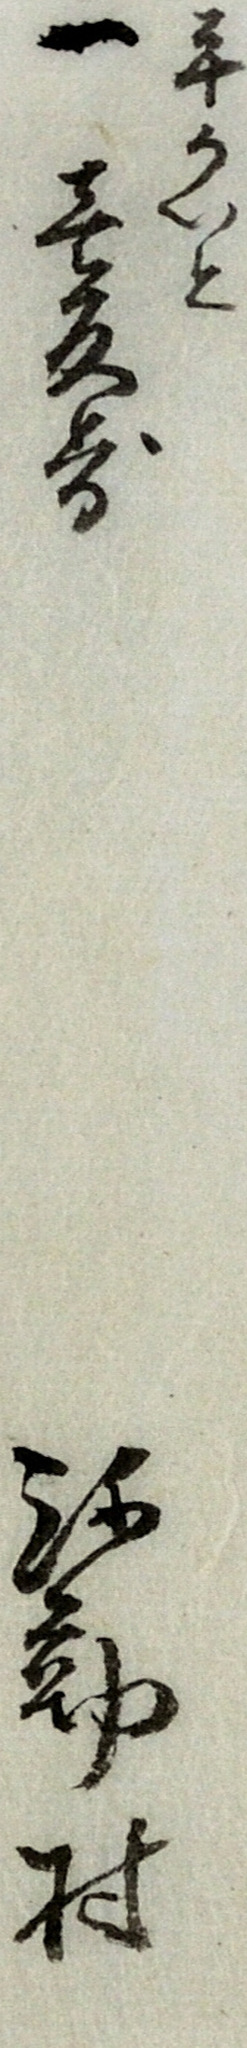一壱反歩弥勒村
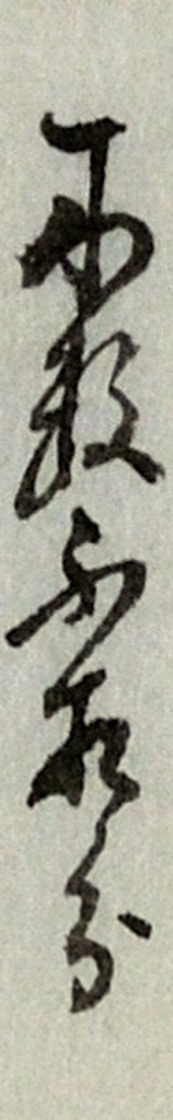木数不相分
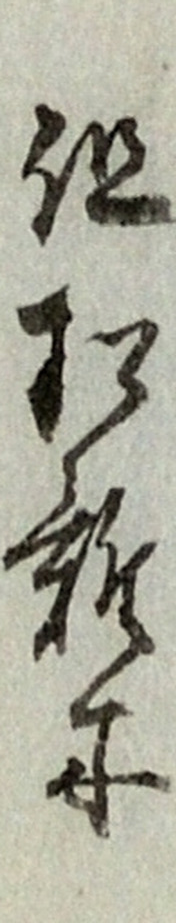但松雑木
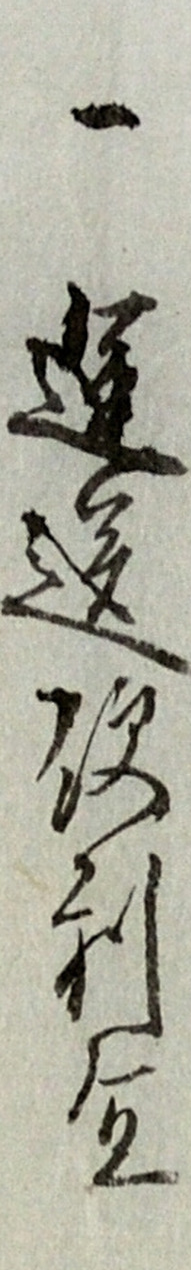一運送便利宜
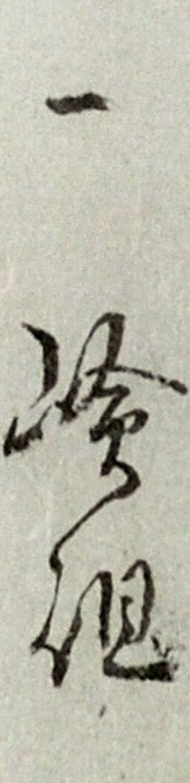一嶮岨

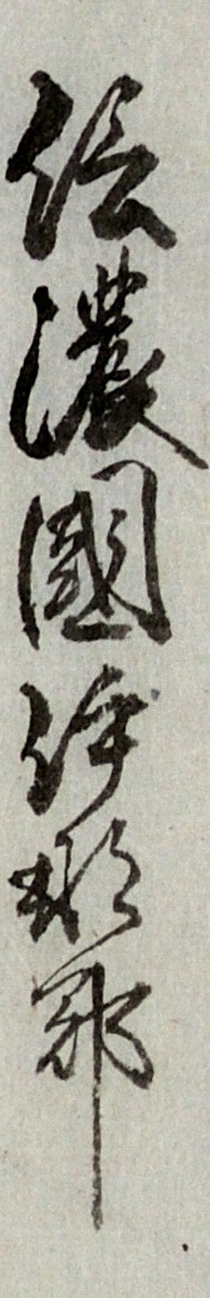信濃国伊那郡
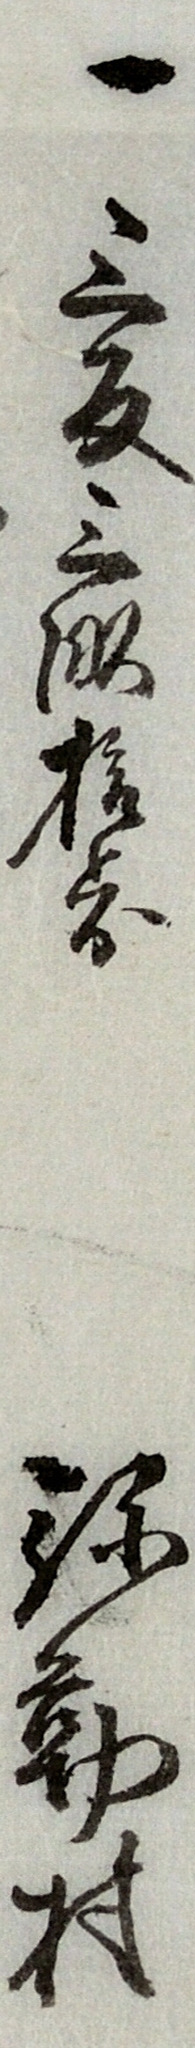一三反三㽗拾歩弥勒村
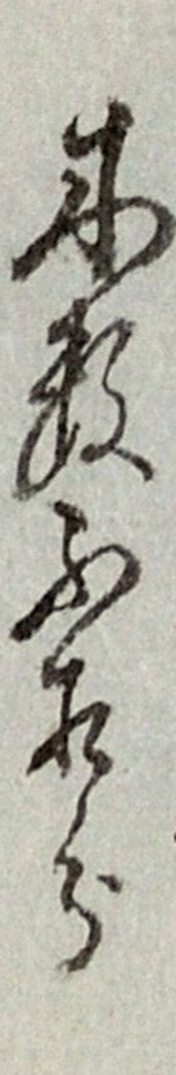木数不相分
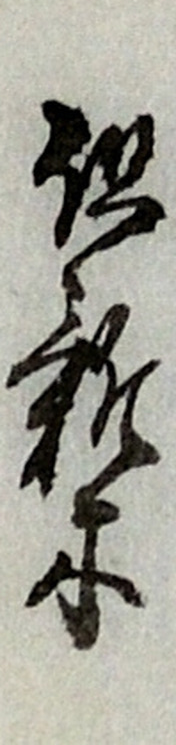但雑木
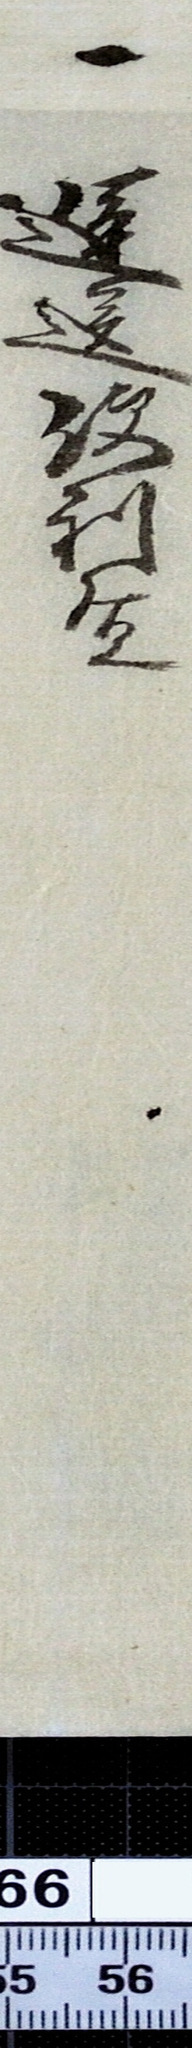一運送便利宜
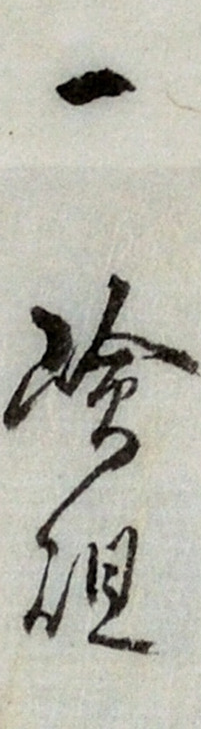一嶮岨
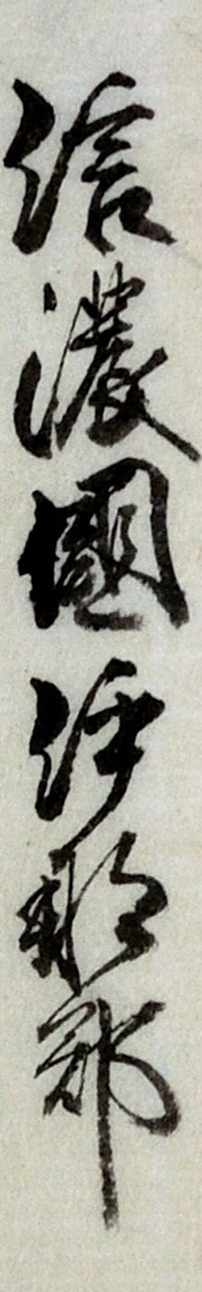信濃国伊那郡
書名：官林反別帳
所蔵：伊那市立高遠町図書館・合同会社AMANE
